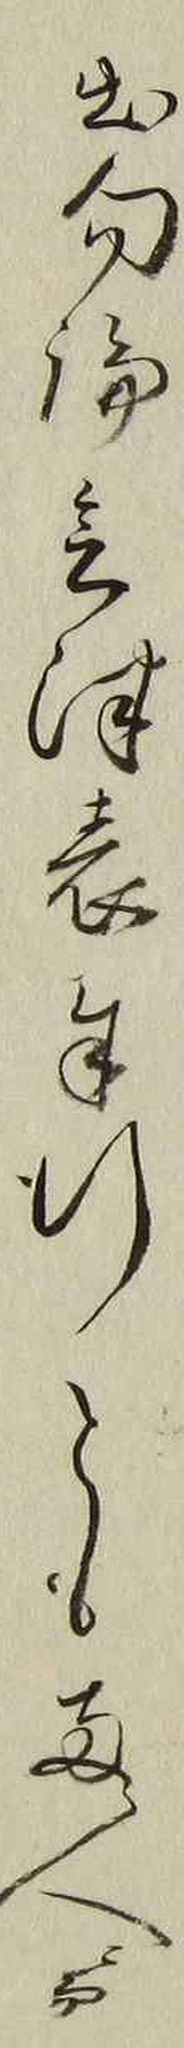出勿論会津表奉行とも両人ニ而
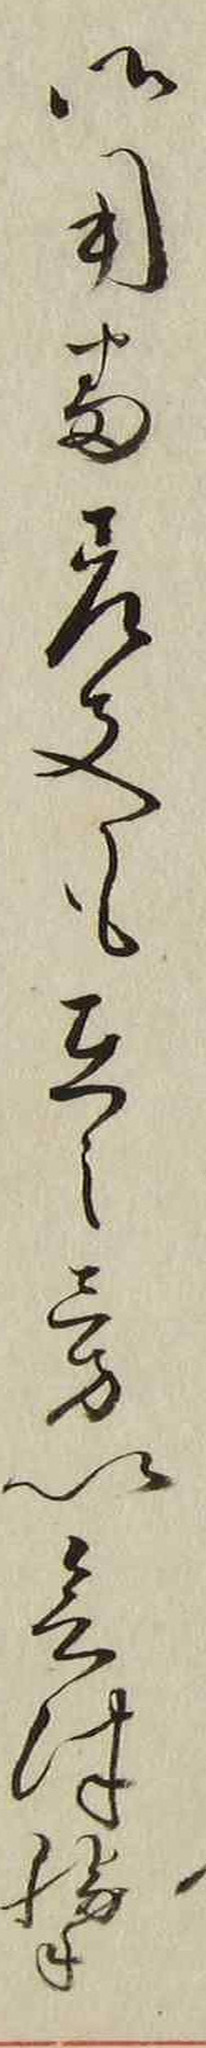御用番差支も在之旁以会津勝手
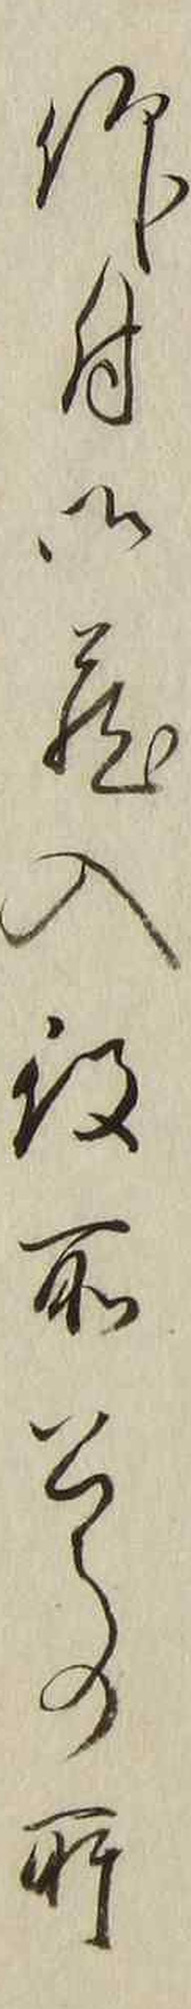被仰付御蔵入役所公事所

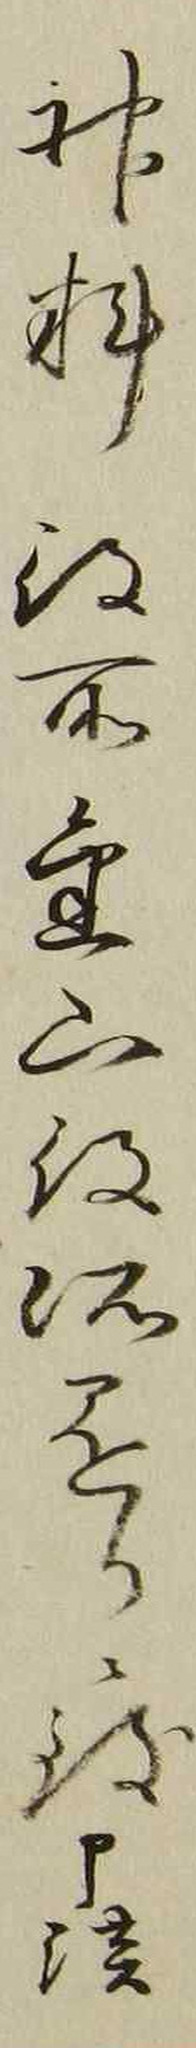神料役所金山役所懸りニ致申談
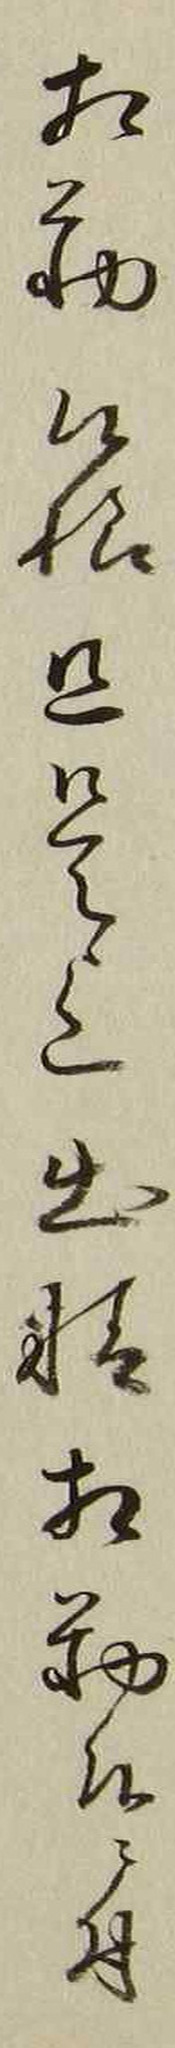相勤候様且是迄出精相勤候ニ付
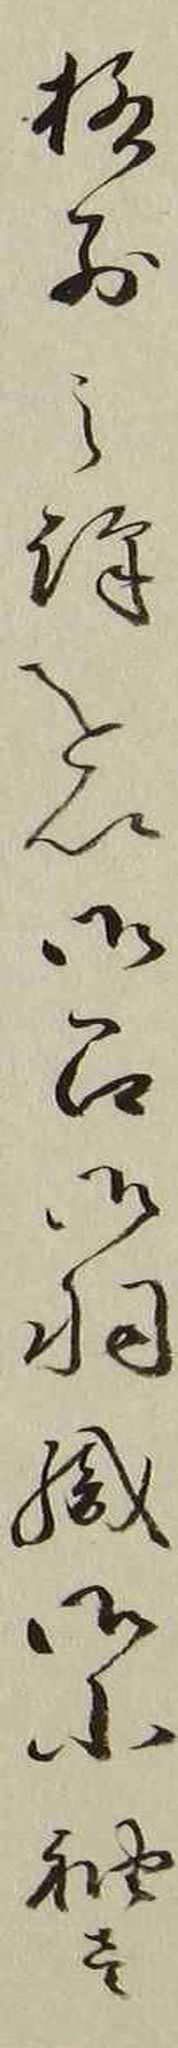格別之許を以御召御羽織御小袖壱
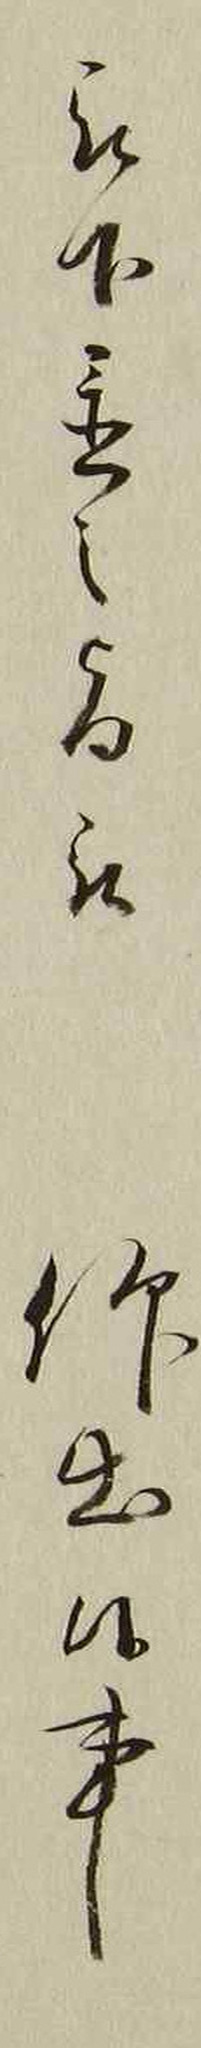被下置之旨被仰出候事
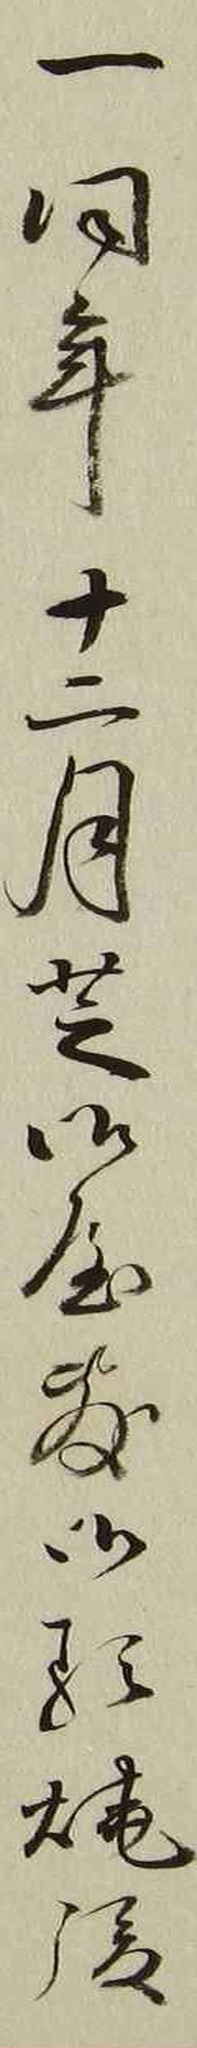一同年十二月芝御屋敷御類焼後
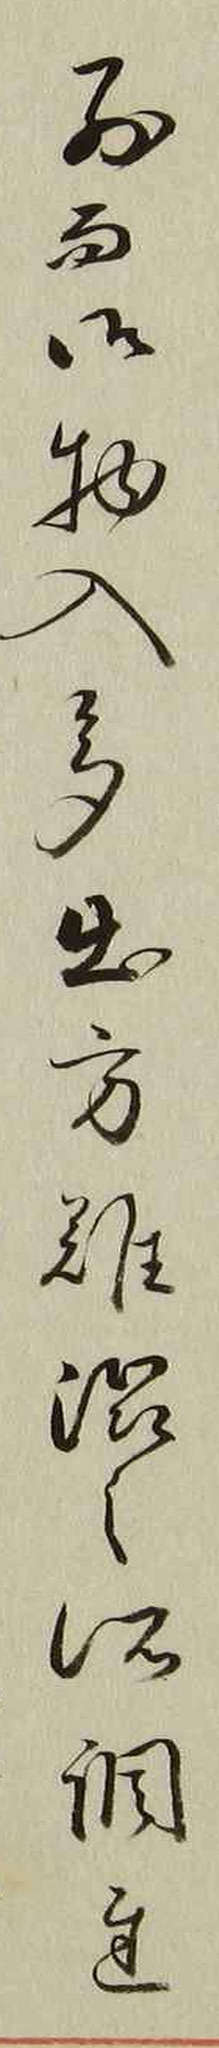別而御物入多出方難渋之所調達
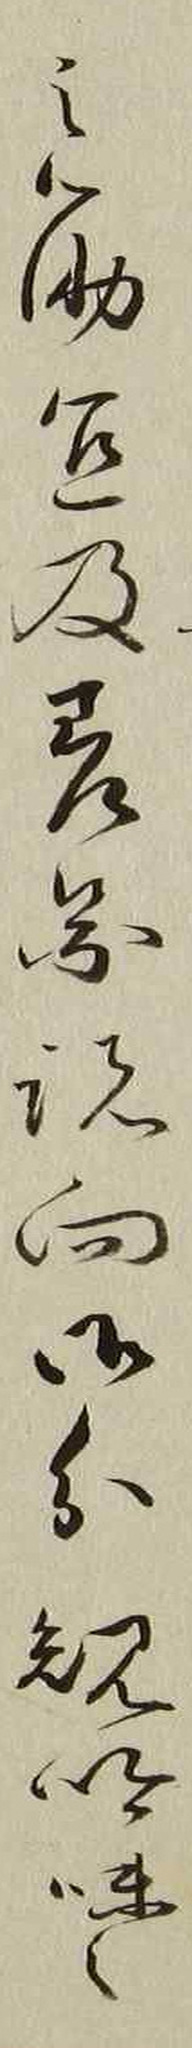之筋宜及差図諸向御分規吟味之
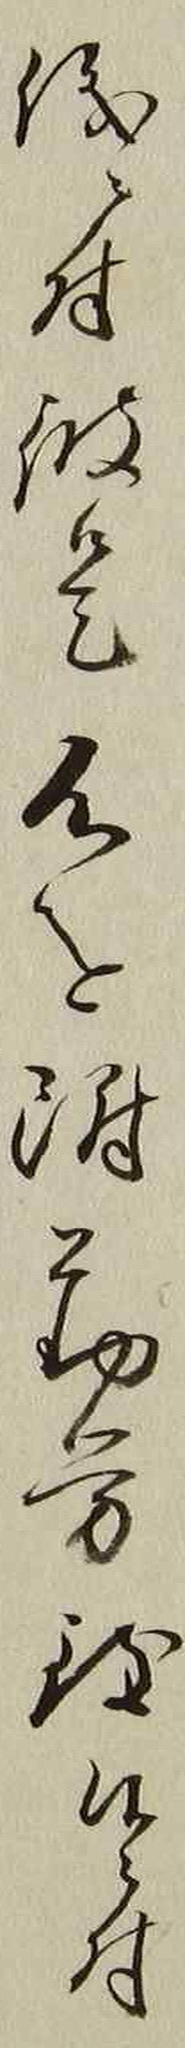儀ニ付彼是心を附勤方致候ニ付
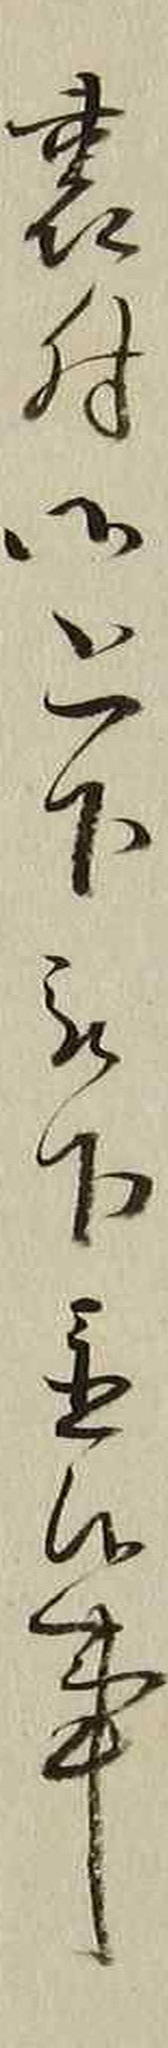裏付御上下被下置候事
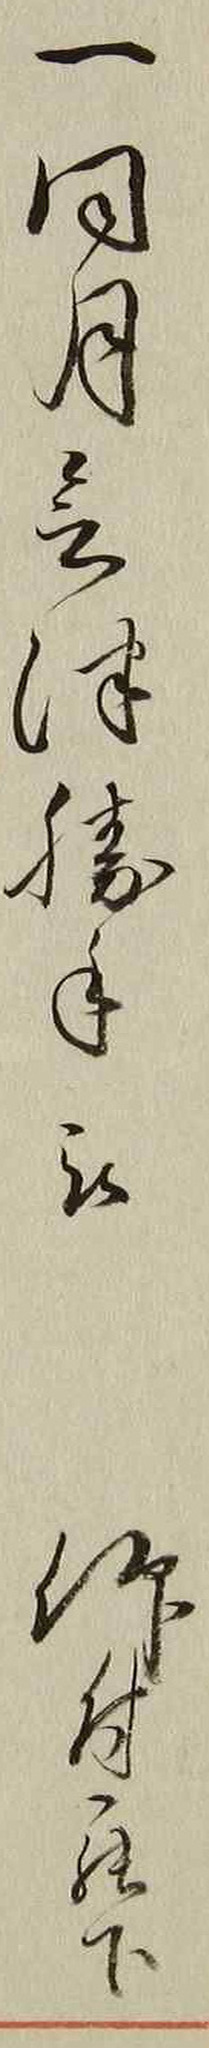一同月会津勝手被仰付罷下
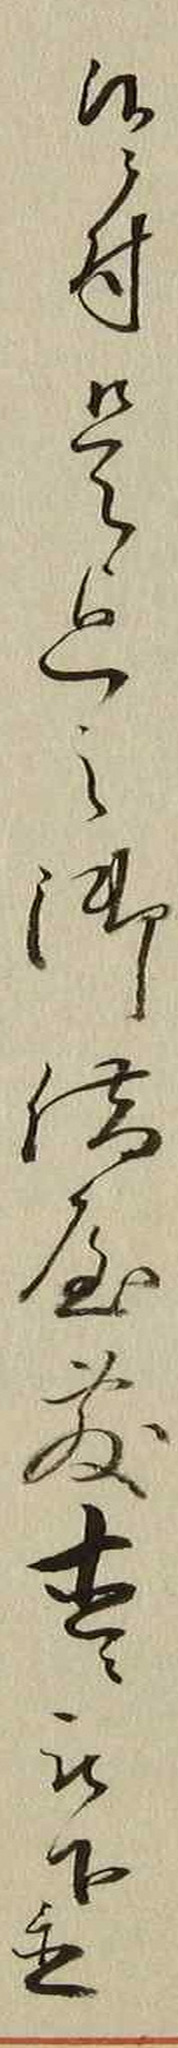候ニ付是迄之御借屋敷直ニ被下置
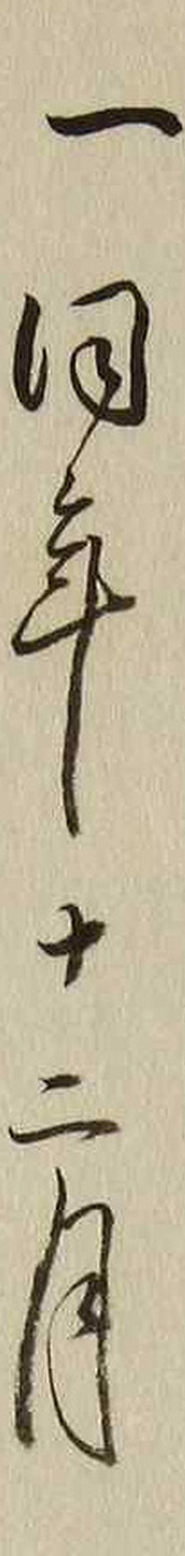一同年十二月
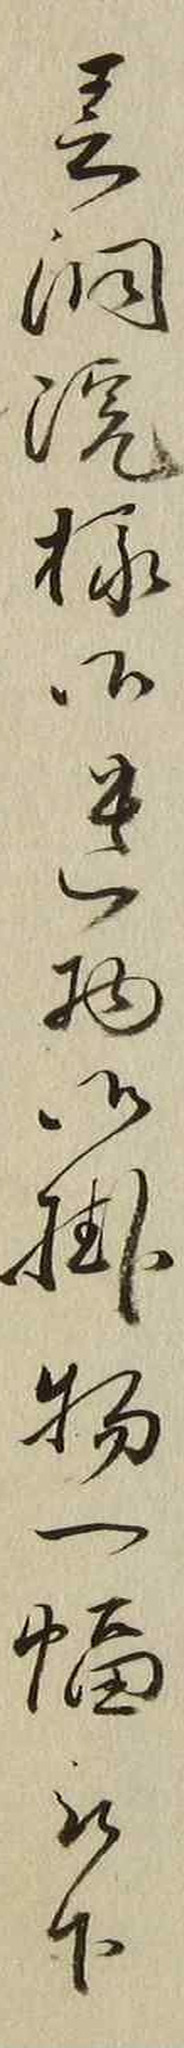春洞院様御遺物御掛物一幅被下
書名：諸士系譜　巻之2　い之部2
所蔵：会津若松市立会津図書館
